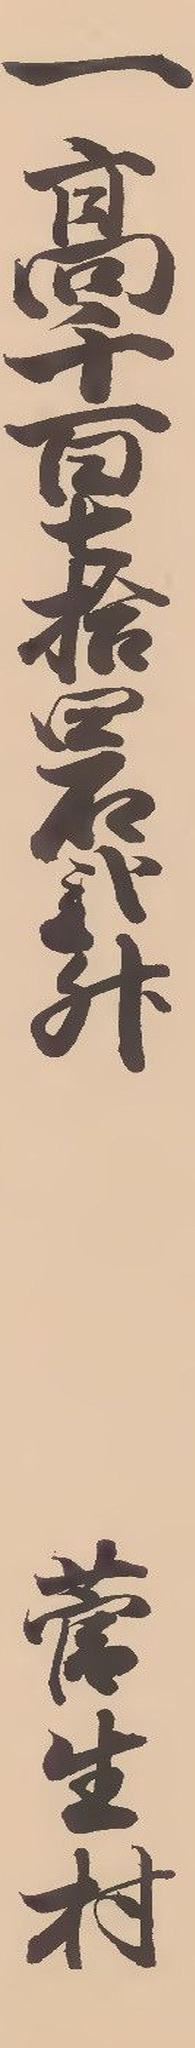一高千百七拾四石弐升菅生村
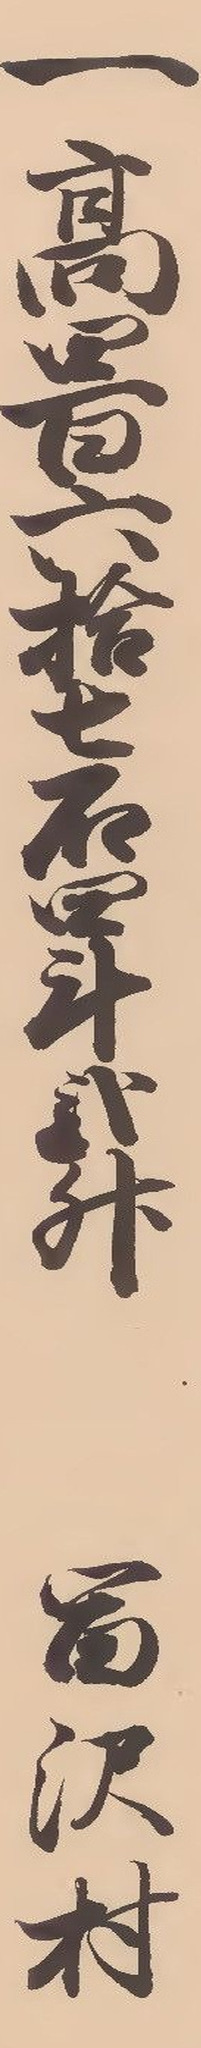一高四百六拾七石四斗弐升富沢村
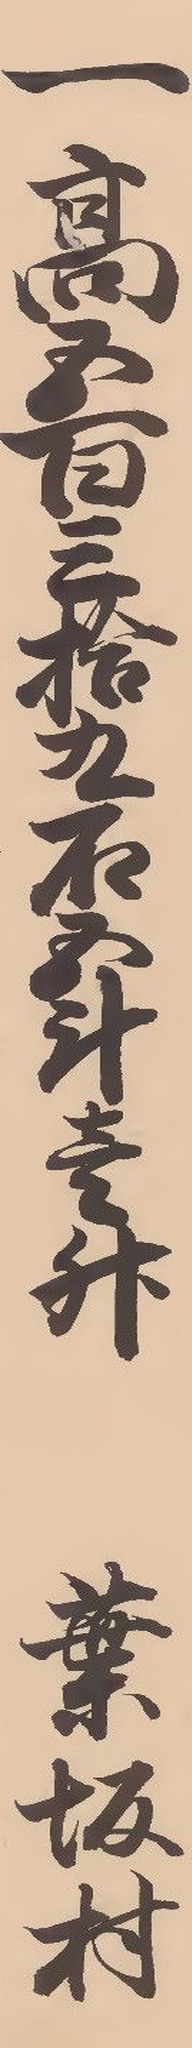一高五百三拾九石五斗壱升葉坂村

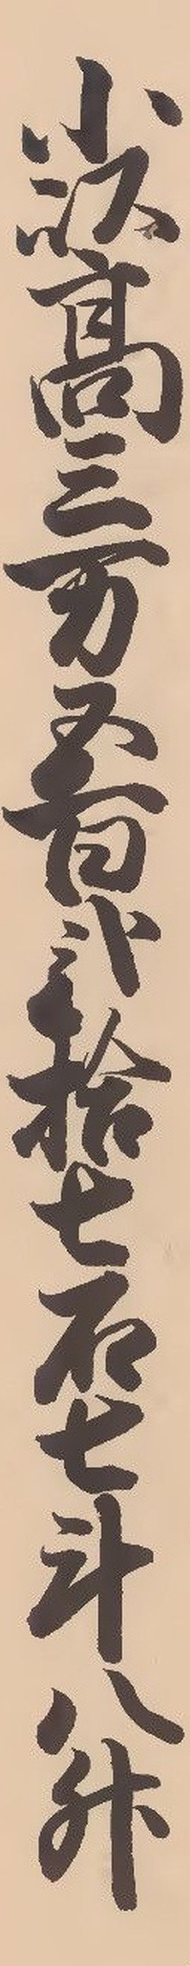小以高三万五百弐拾七石七斗八升
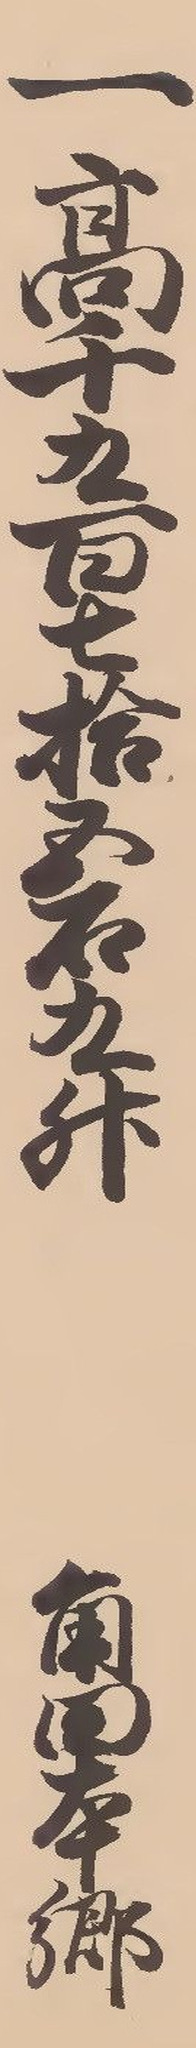一高千九百七拾五石九升角田本郷
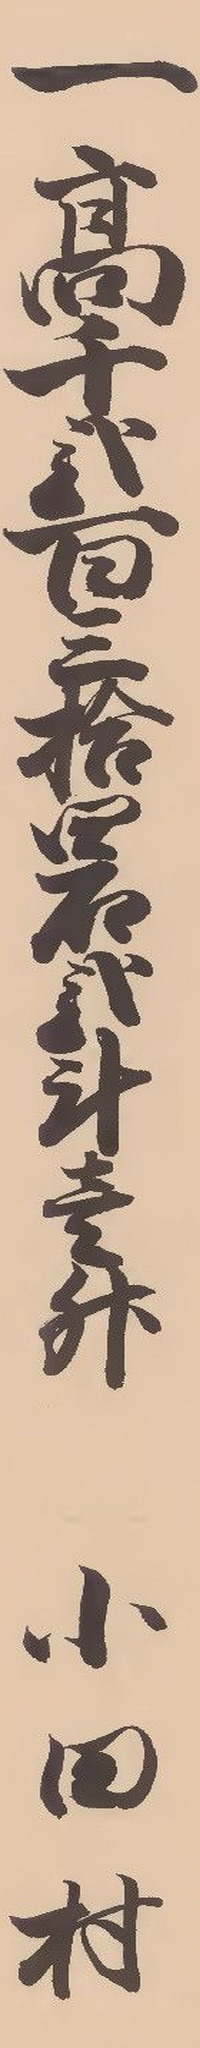一高千弐百三拾四石弐斗壱升小田村
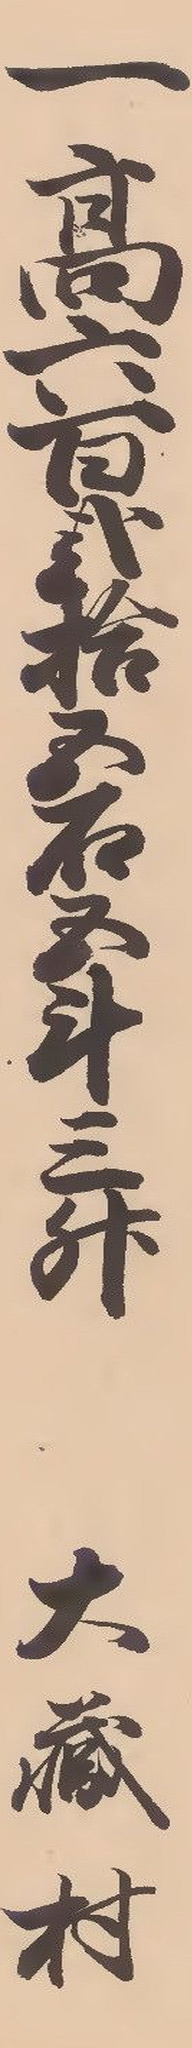一高六百弐拾五石五斗三升大蔵村

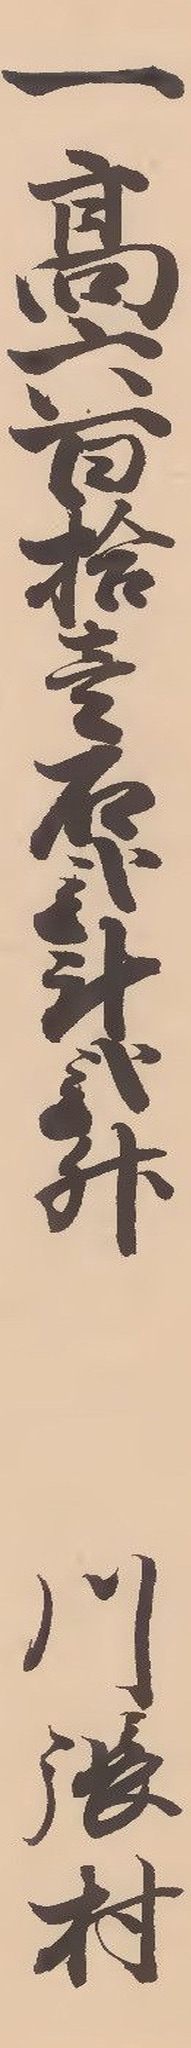一高六百拾壱石弐斗弐升川張村
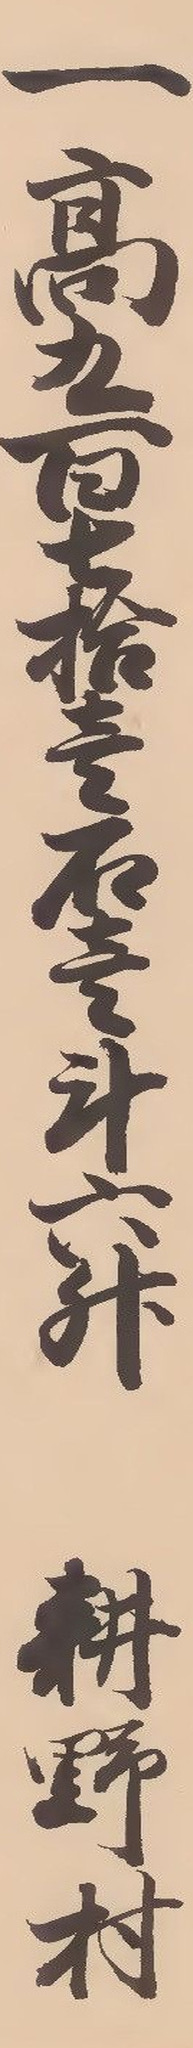一高九百七拾壱石壱斗六升耕野村
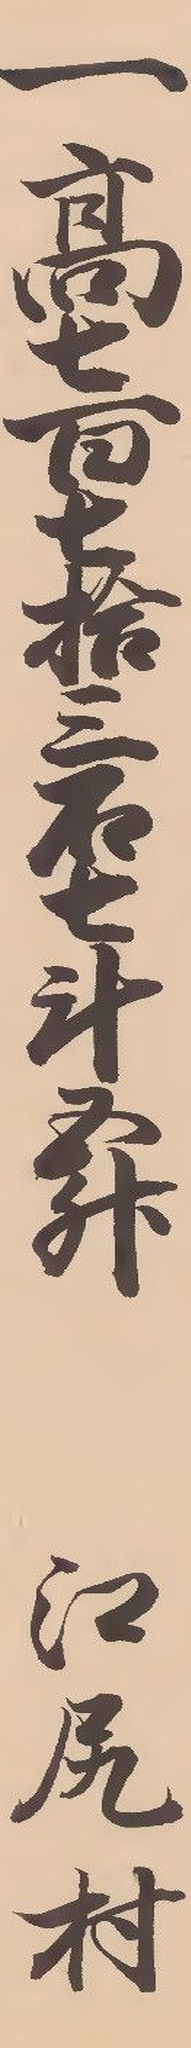一高七百七拾三石七斗五升江尻村
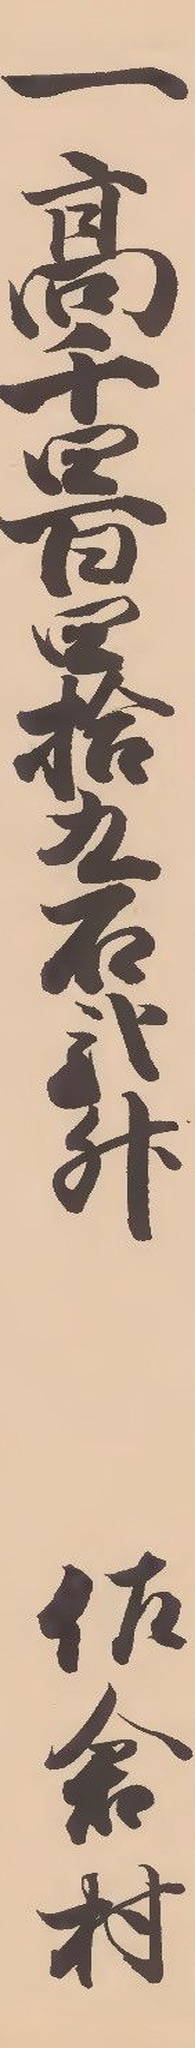一高千四百四拾九石弐升佐倉村
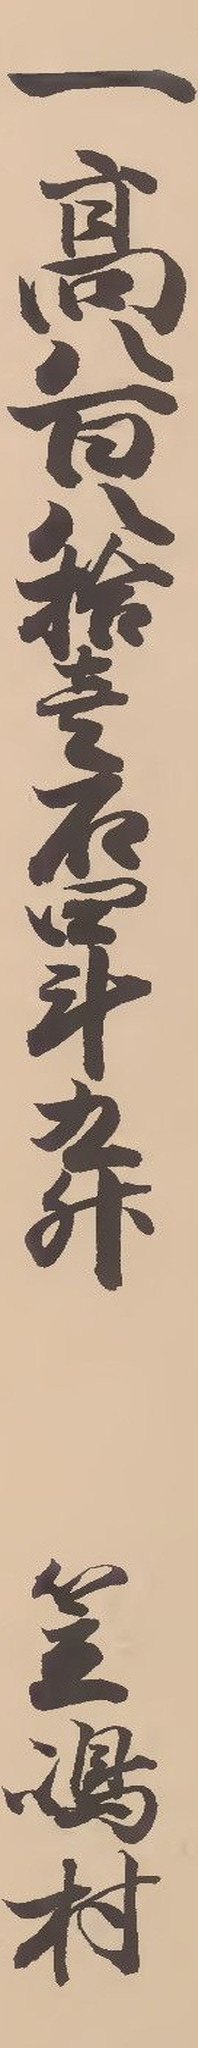一高八百八拾壱石四斗九升笠島村
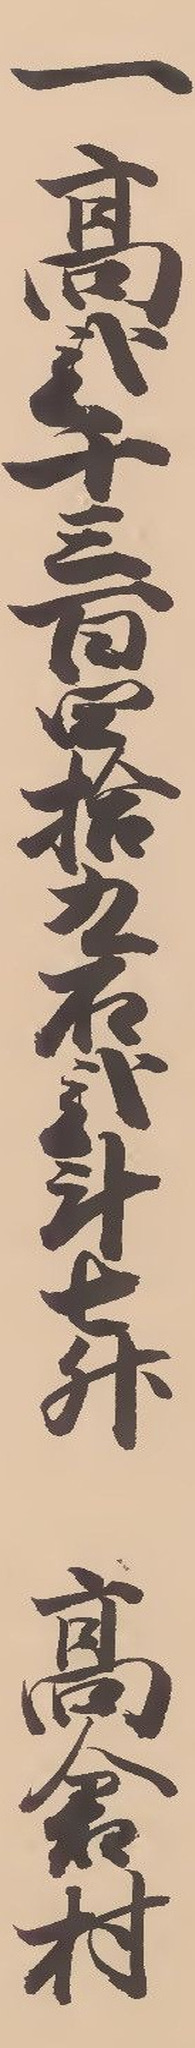一高弐千三百四拾九石弐斗七升高倉村
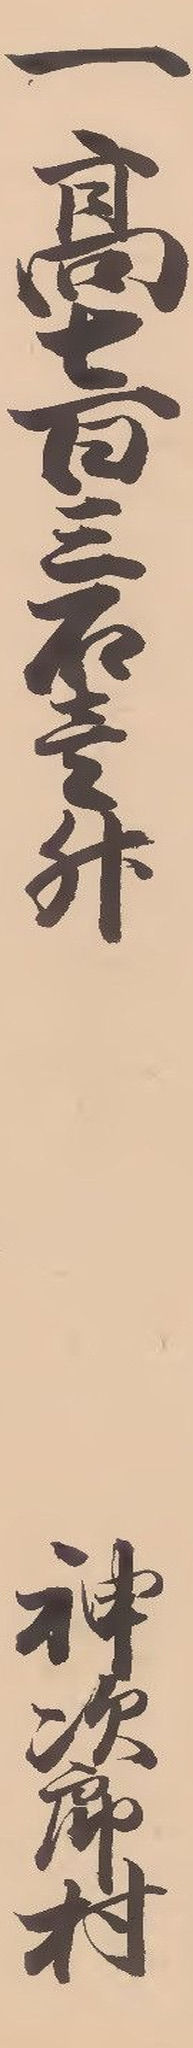一高七百三石壱升神次郎村
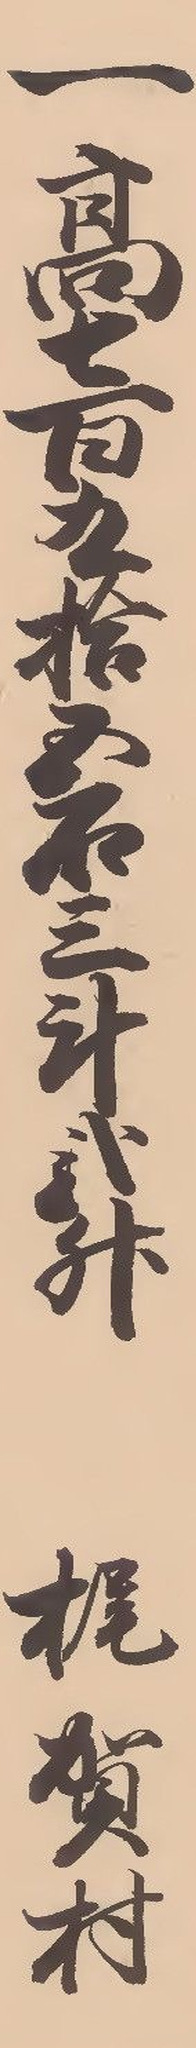一高七百九拾五石三斗弐升梶賀村

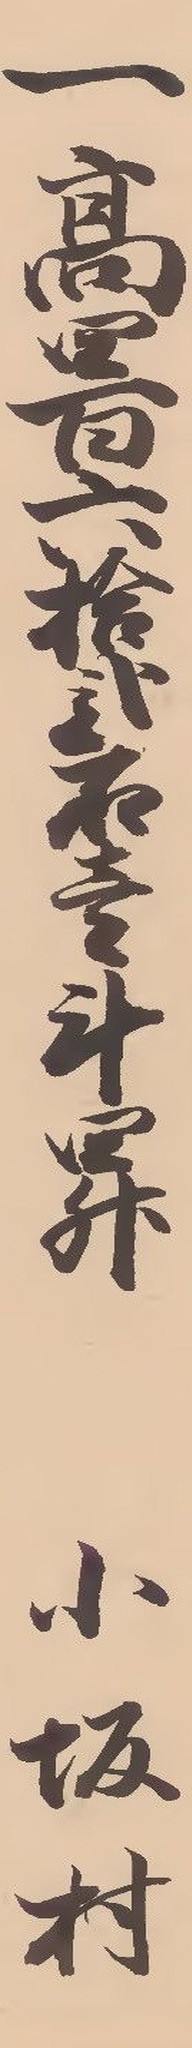一高四百六拾弐石壱斗四升小坂村
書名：陸奥国郷帳　５
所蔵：国立公文書館 National Archives of Japan
